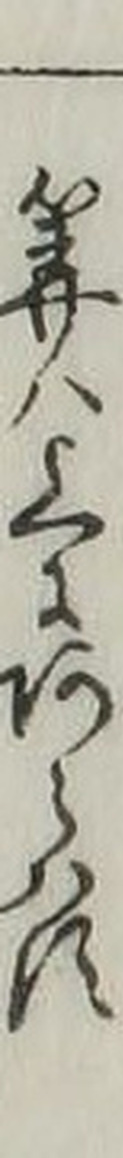の算は上にあらはす
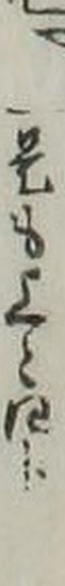是も上と四分
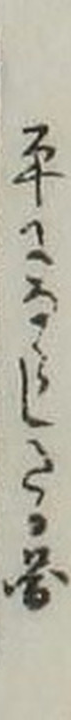平にならしたる図
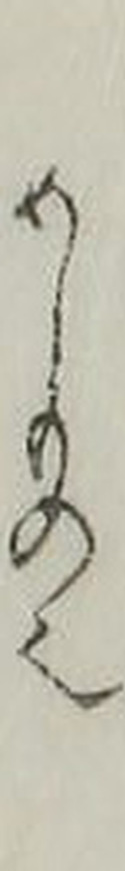めしもの也
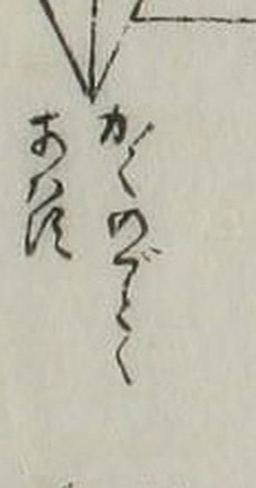かくのごとく寸

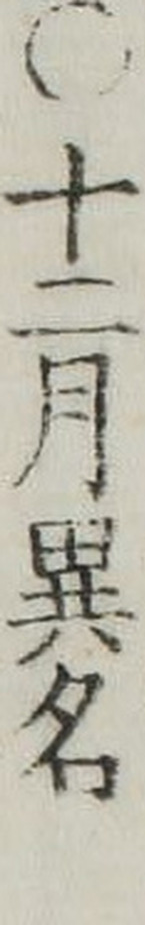○十二月異名
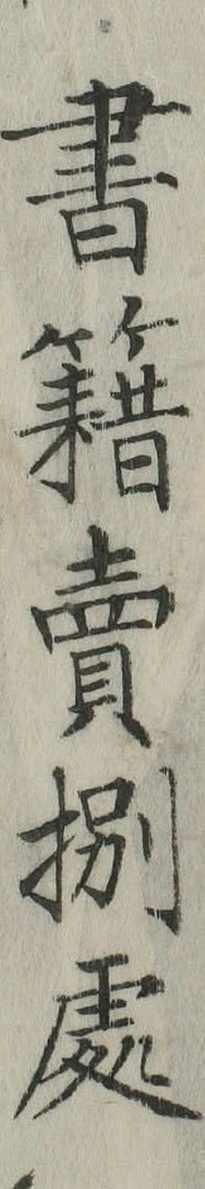書籍売捌処
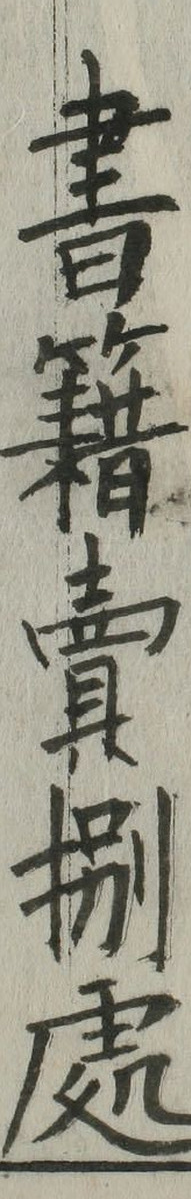書籍売捌処
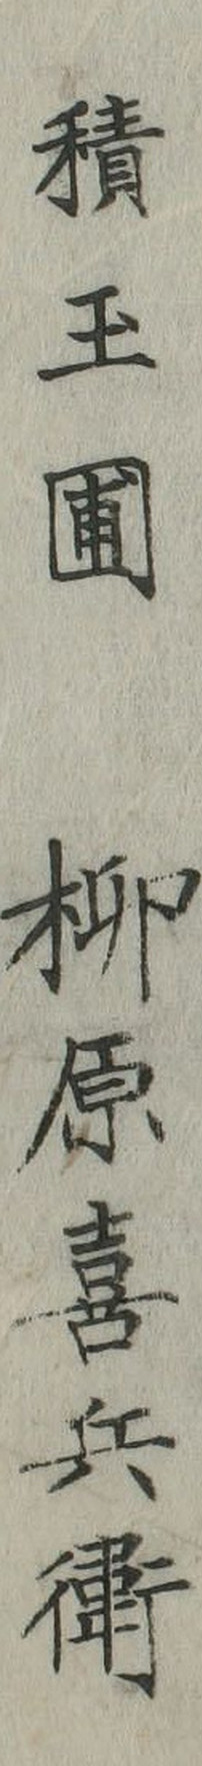積玉圃柳原喜平衛

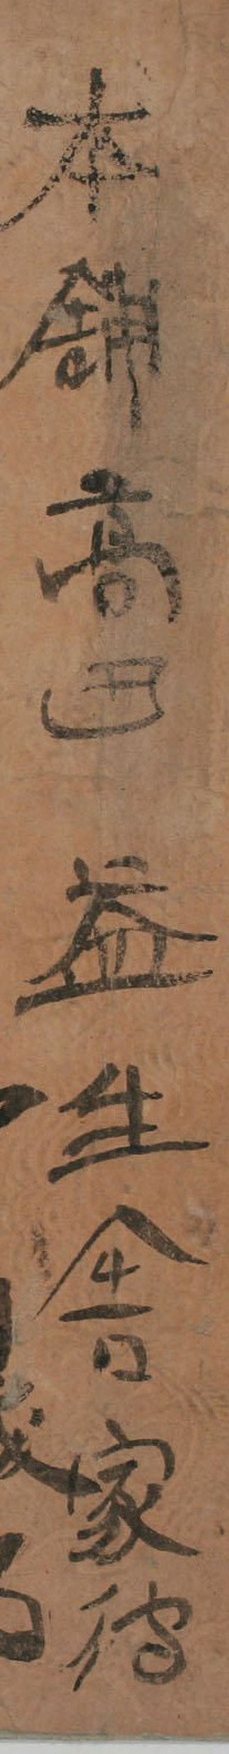本舗高田益生舎家ノ伝
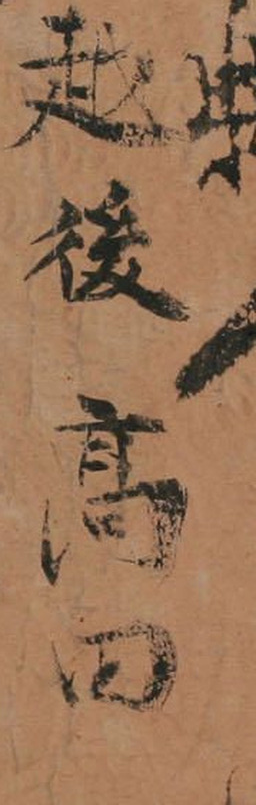越後高田
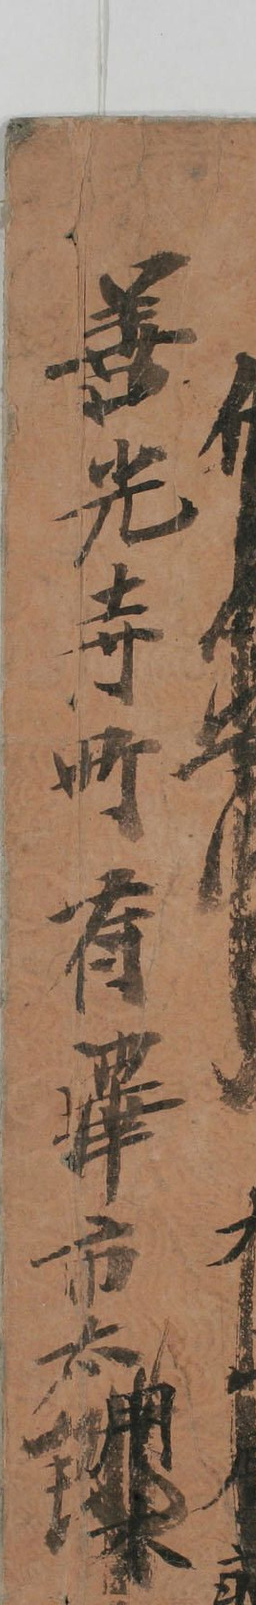善光寺町有沢市太郎
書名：宝玉塵劫記
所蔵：東京学芸大学教育コンテンツアーカイブ
